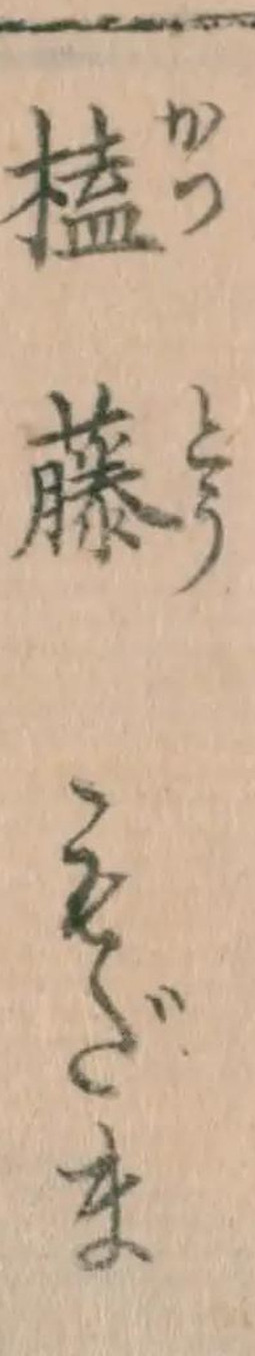榼藤もだま

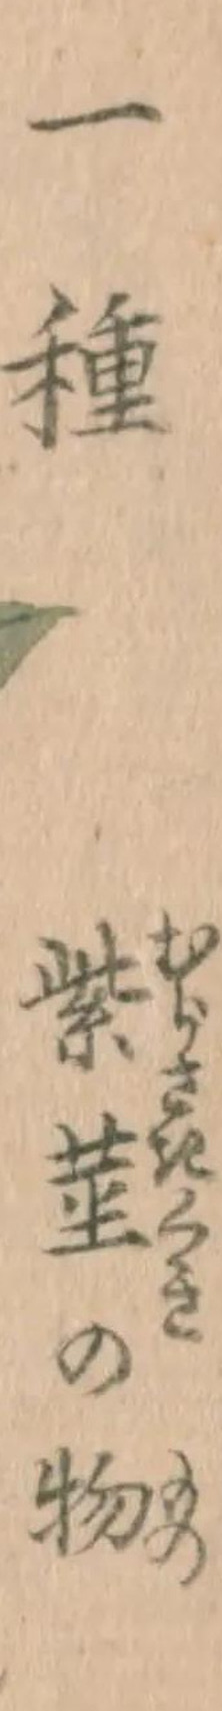一種紫茎の物
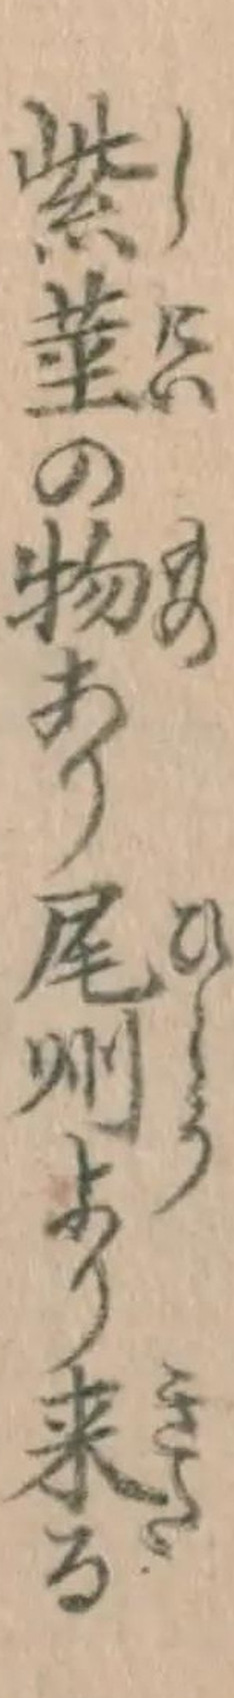紫茎の物あり尾州より来る
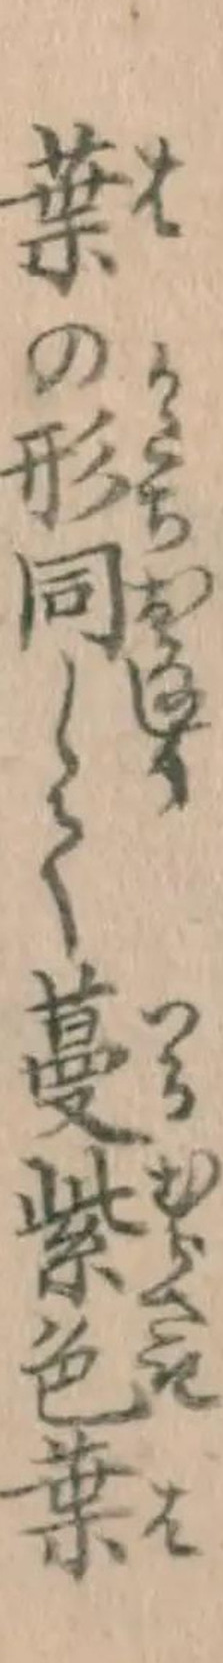葉の形同して蔓紫色葉
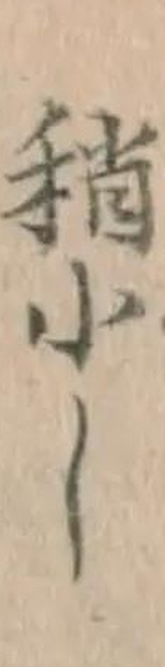稍小し

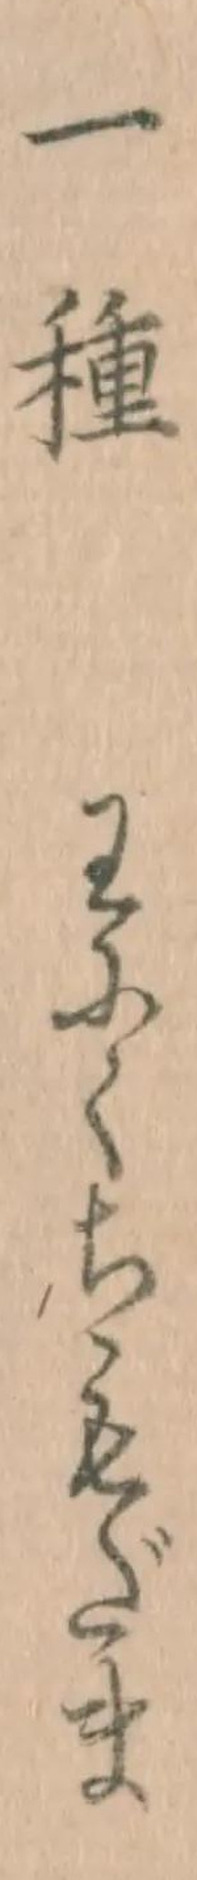一種わにくちもだま

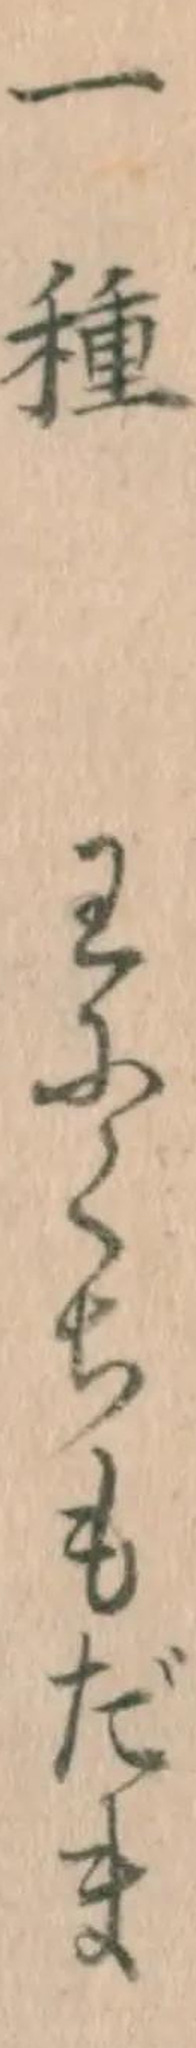一種わにくちもだま
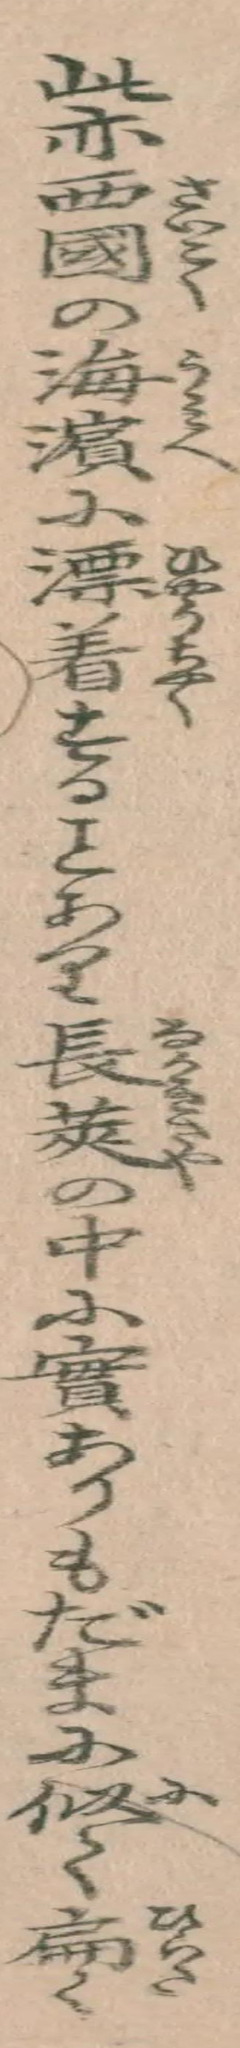此亦西国の海浜に漂着することあり長莢の中に実ありもだまに似て扁く
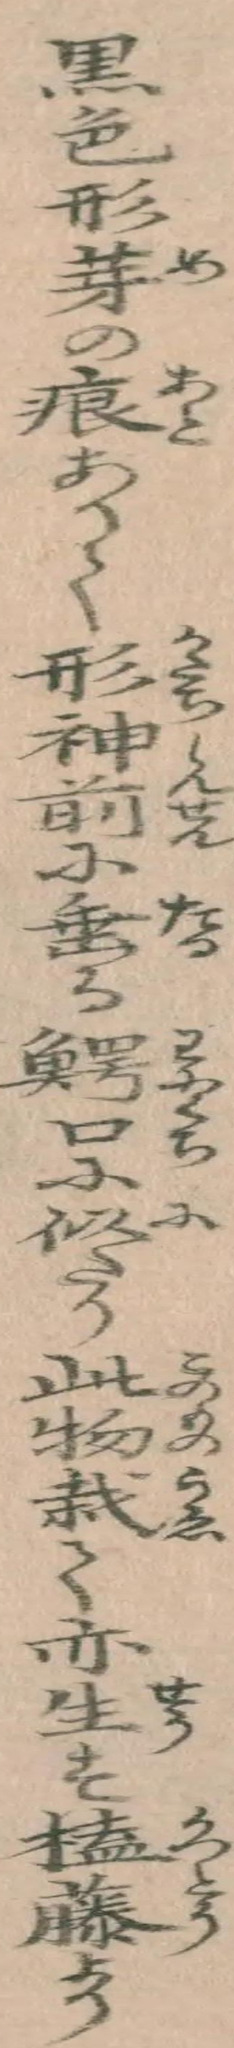黒色形芽の痕ありて形神前に垂る鰐口に似たり此物栽て亦生す榼藤より
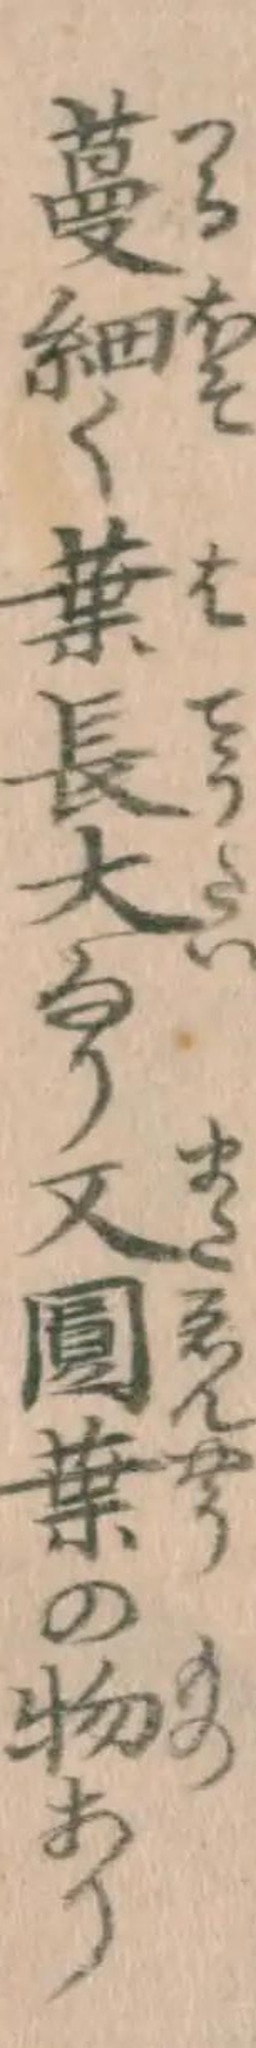蔓細く葉長大なり又円葉の物あり
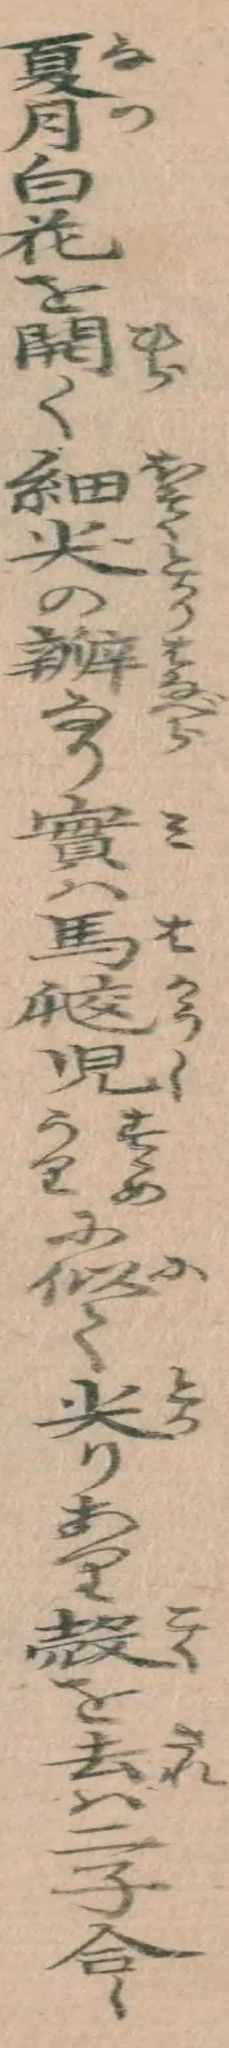夏月白花を開く細尖の弁なり実は馬㼎児すゝめうりに似て尖りあり穀を去は二子合し
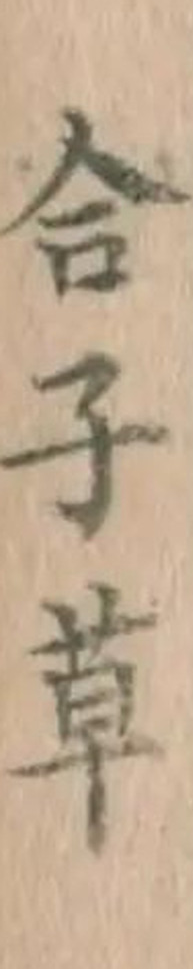合子草

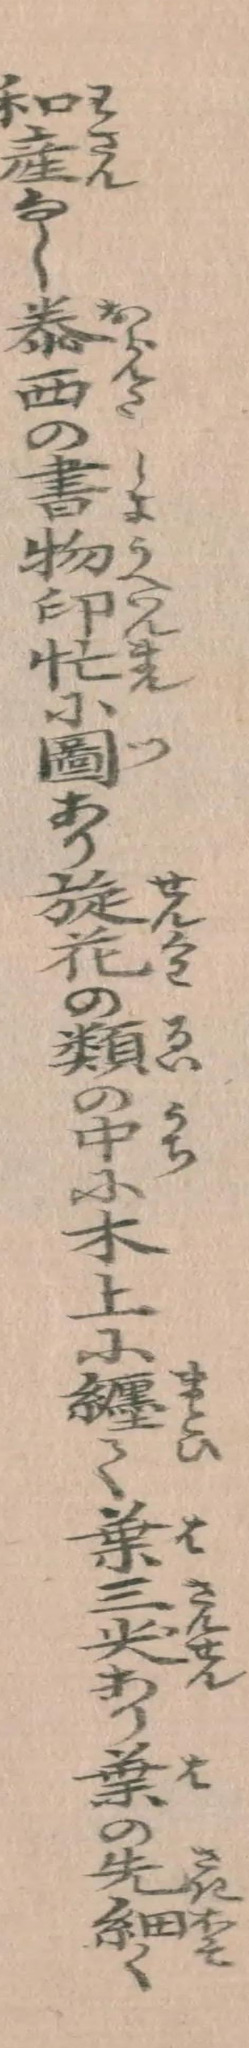和産なし泰西の書物印忙に図あり旋花の類の中に木上に纏て葉三尖あり葉の先細く
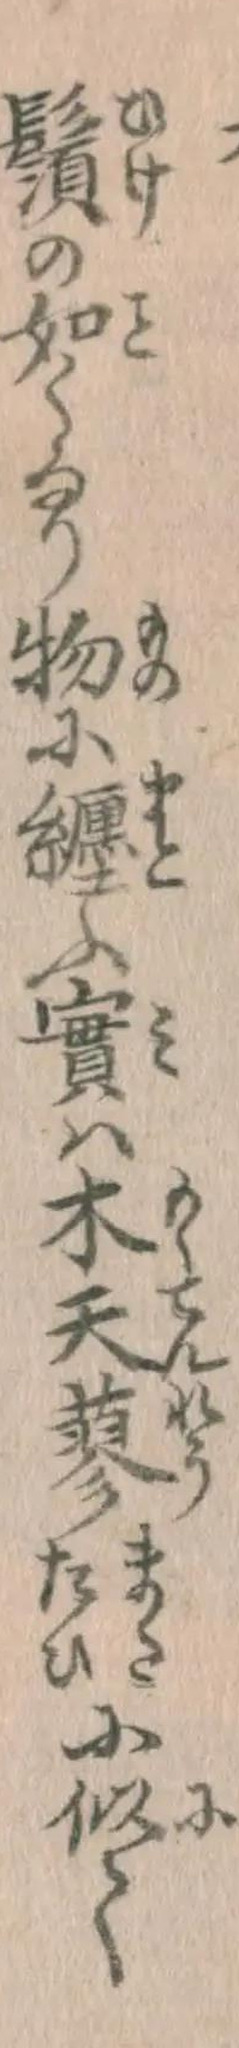鬚の如くなり物に纏ふ実は木天蓼またたひに似て
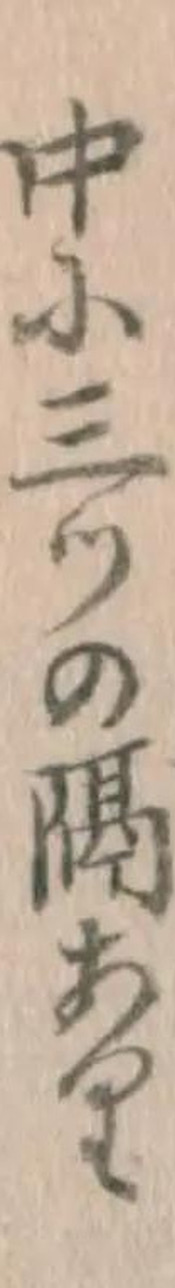中に三つの隔あり

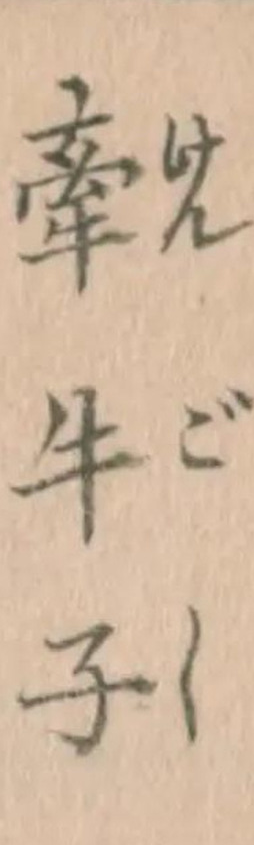牽牛子
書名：本草図譜. 巻25-27
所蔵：国立国会図書館 National Diet Library, JAPAN
